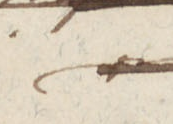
of the ancient
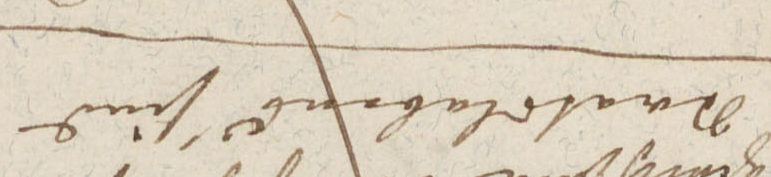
und neuerer Zeit, für uns
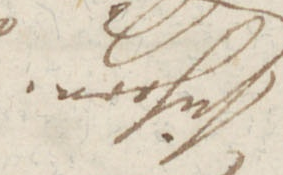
zunächst
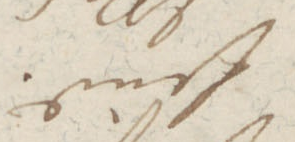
sichern.
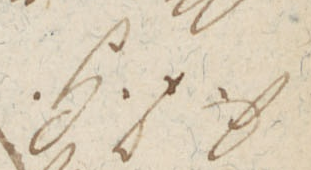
unterordneten.
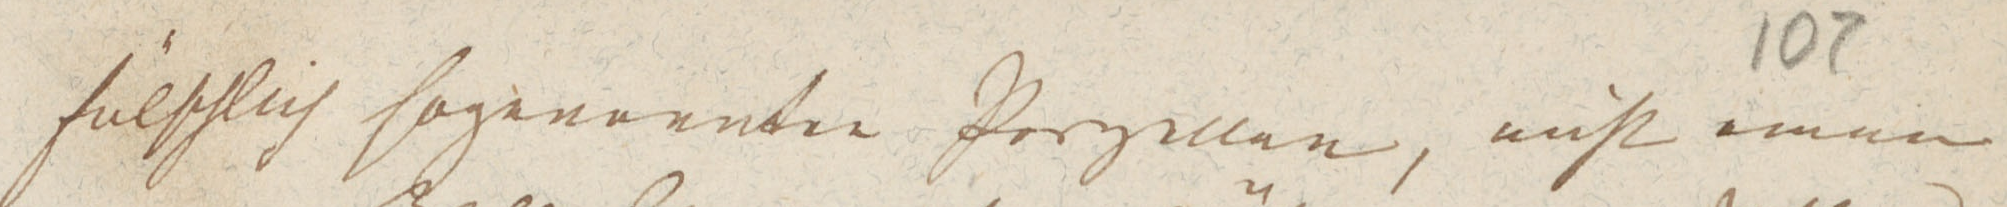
fälschlich sogenannten Porzellan, nicht einen
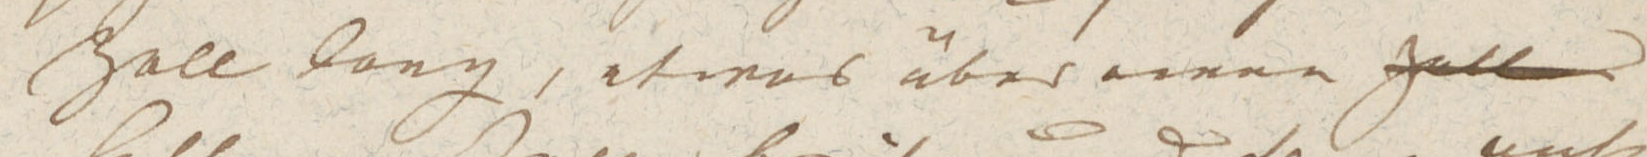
Zoll lang, etwas über einen Zoll
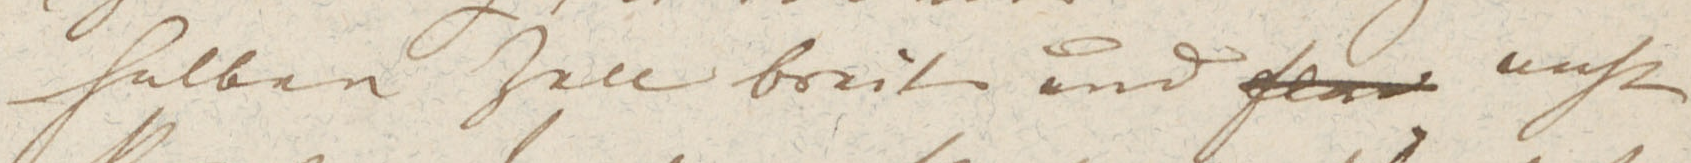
halben Zoll breit und flac nicht
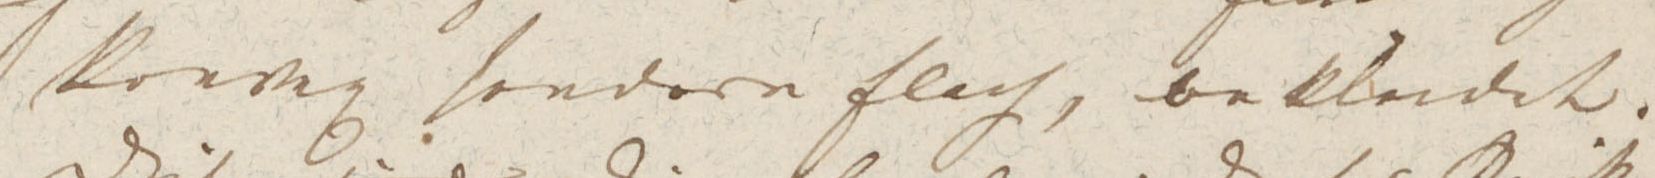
konvex sondern flach, bekleidet.
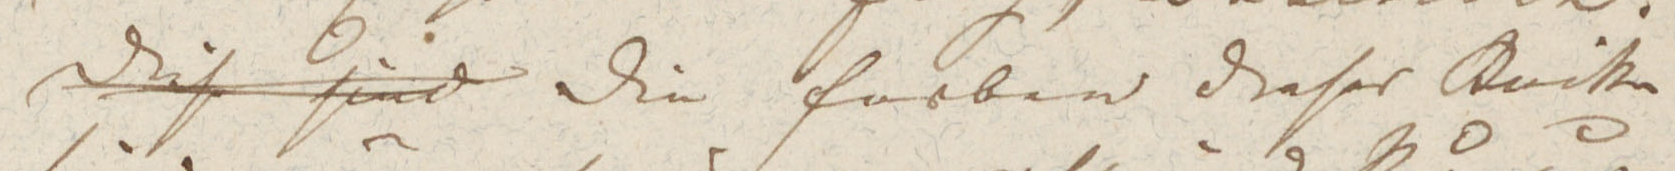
Diese sind Die Farben dieser Stücke
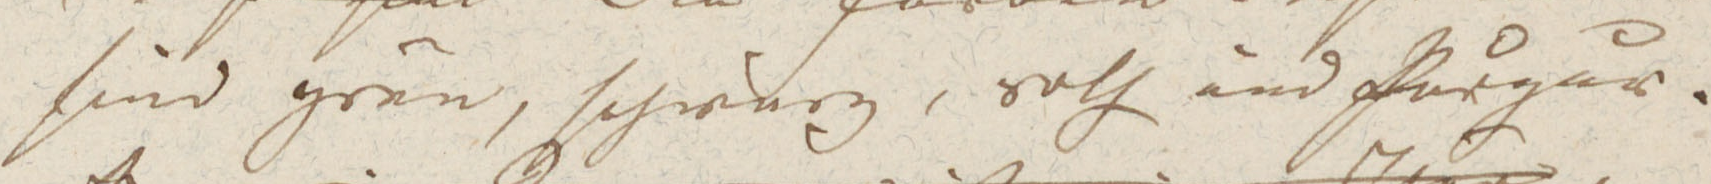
sind grün, schwarz, roth und Purpur.
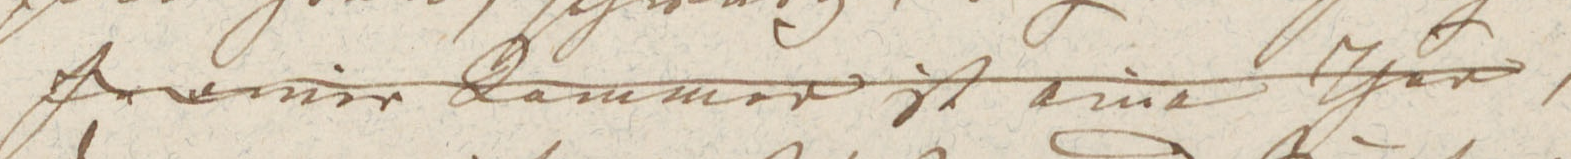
In einer Kammer ist eine Thür,
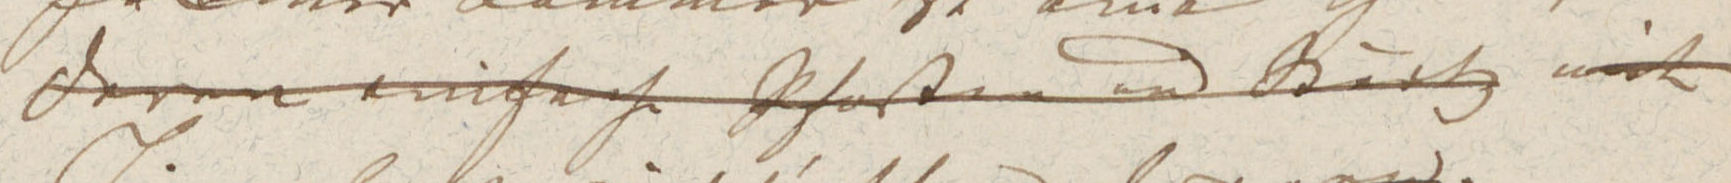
deren einfach Pfosten und Sturtz mit
